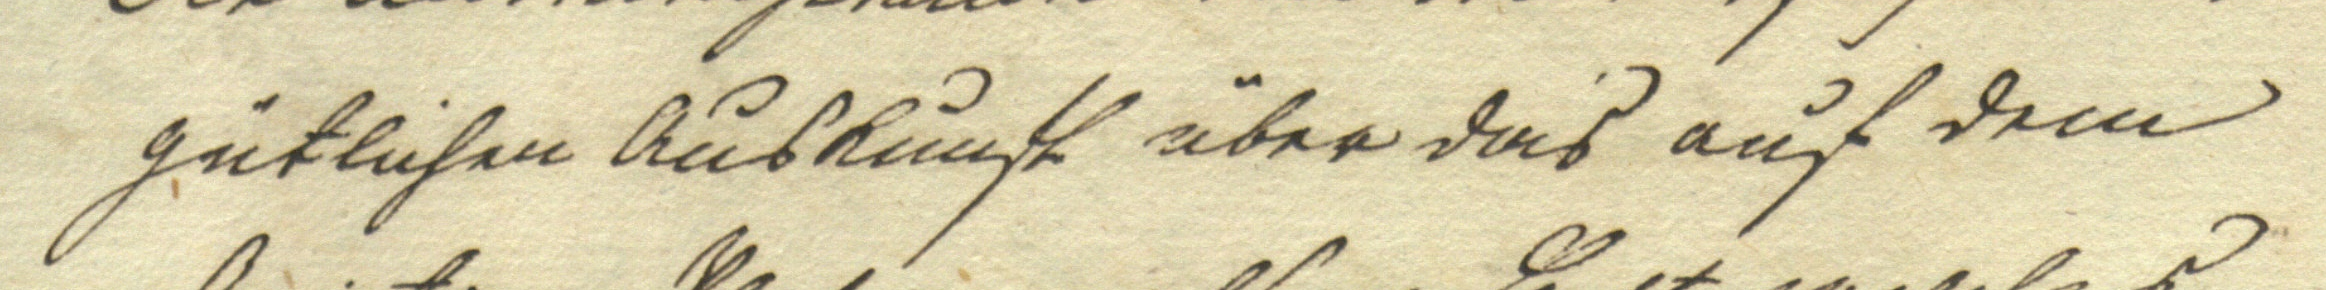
gütlichen Auskunft über das auf dem
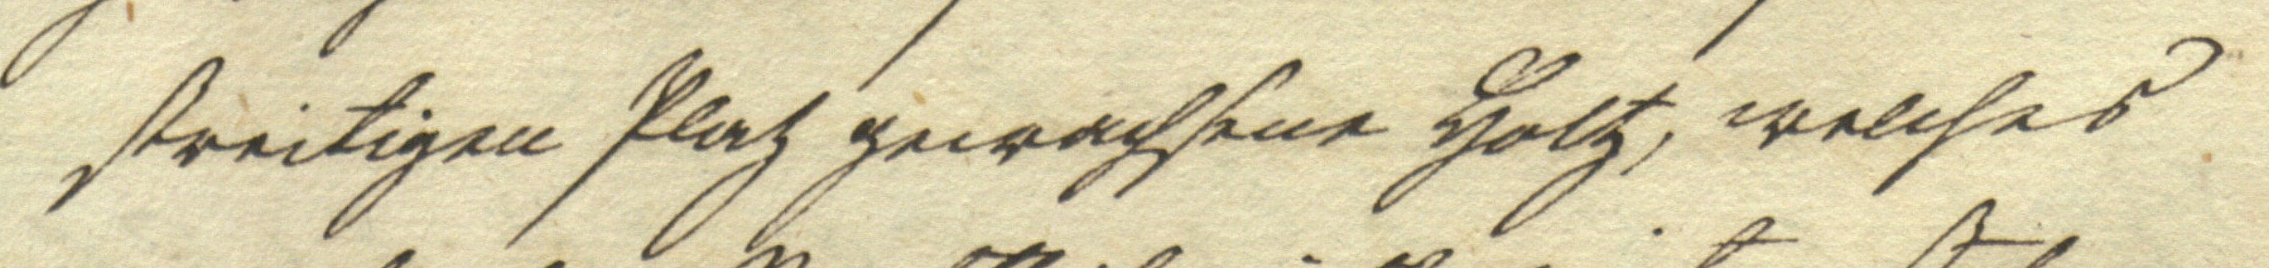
streitigen Plaz gewachsene Holtz, welches
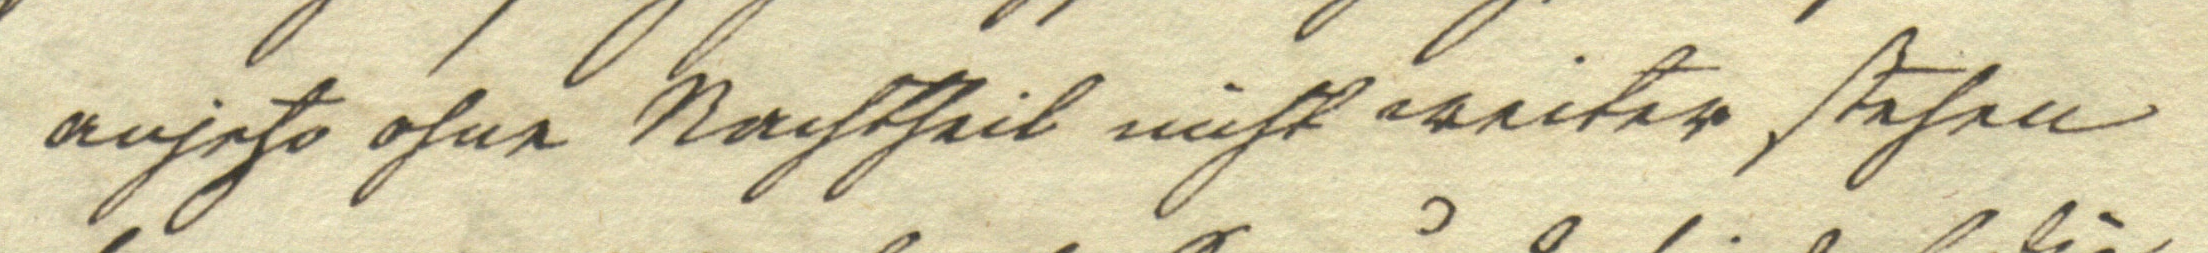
anjetzo ohne Nachtheil nicht weiter stehen
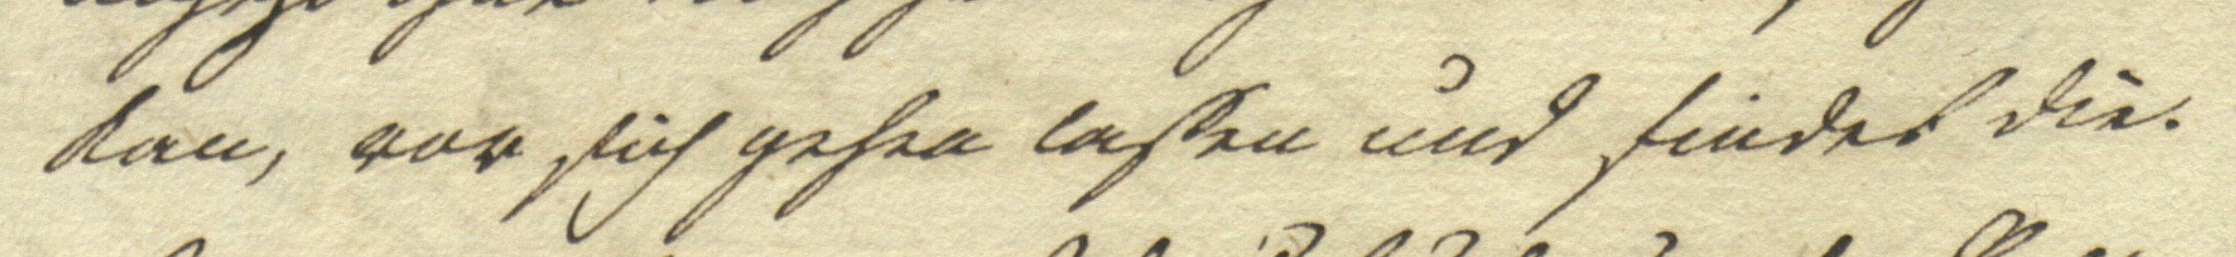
kan, vor sich gehen lassen und findet die¬
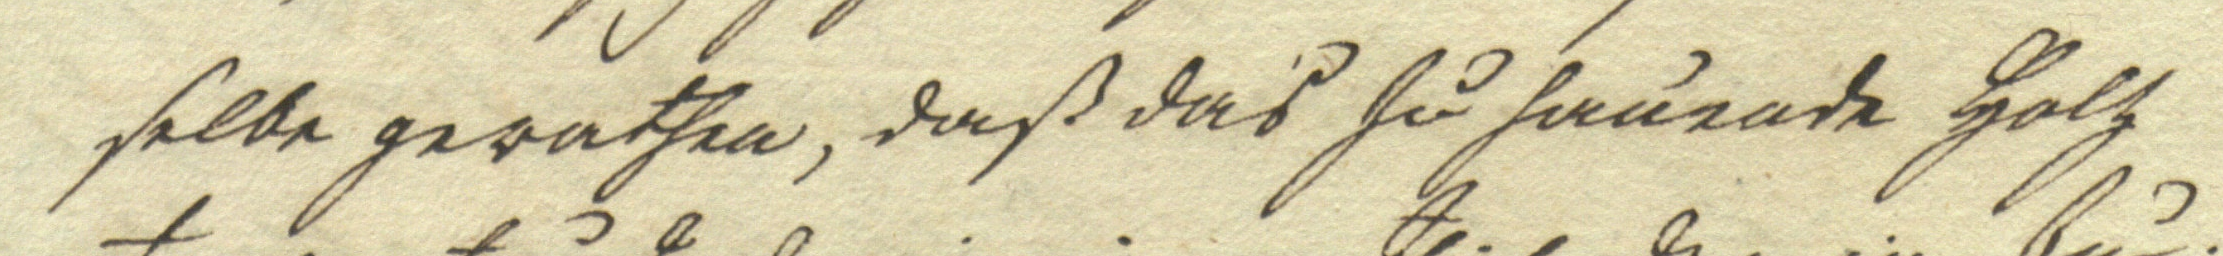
selbe gerathen, daß das zu hauende Holz
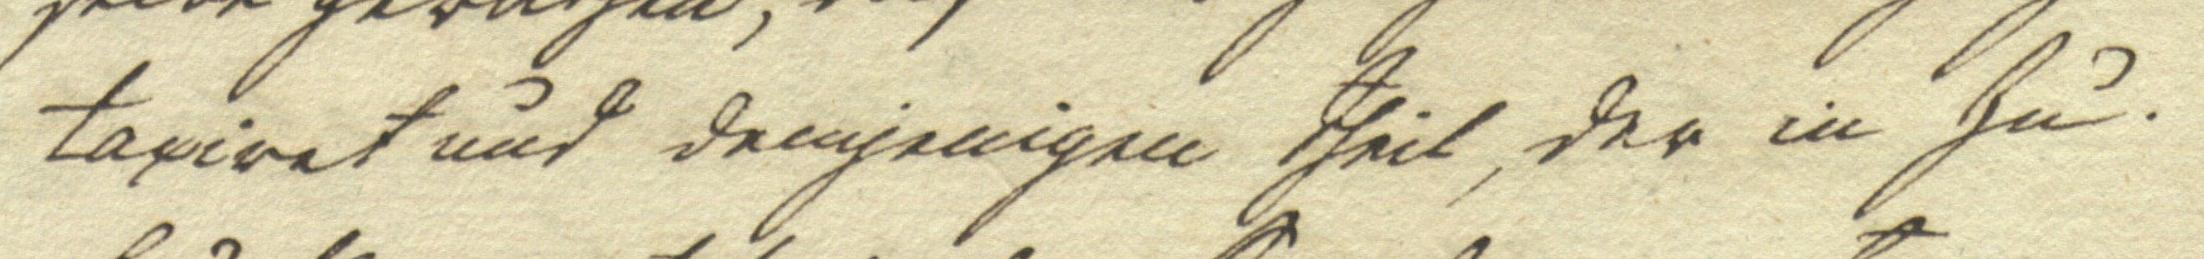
taxiret und denjenigen Theil, der in Zu¬
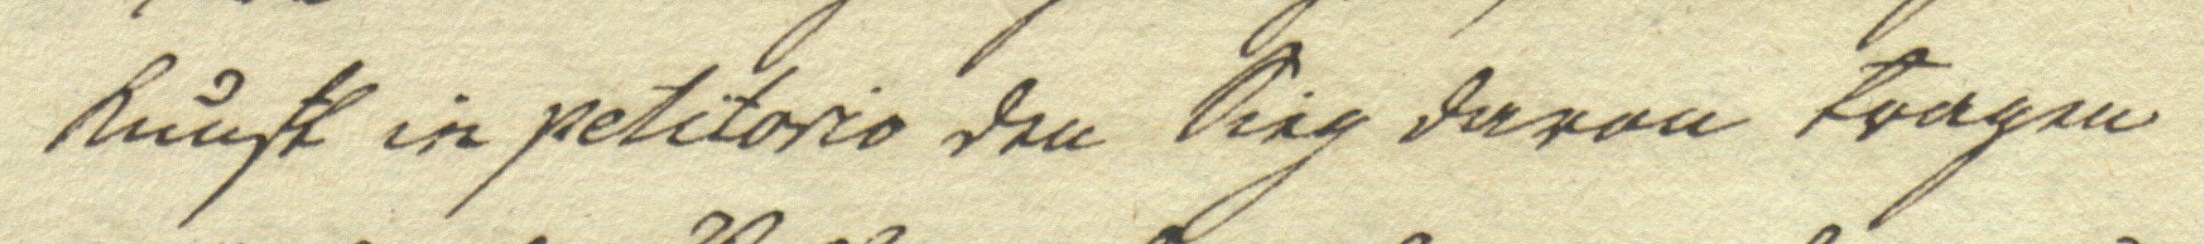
kunft in petitorio den Sieg davon tragen
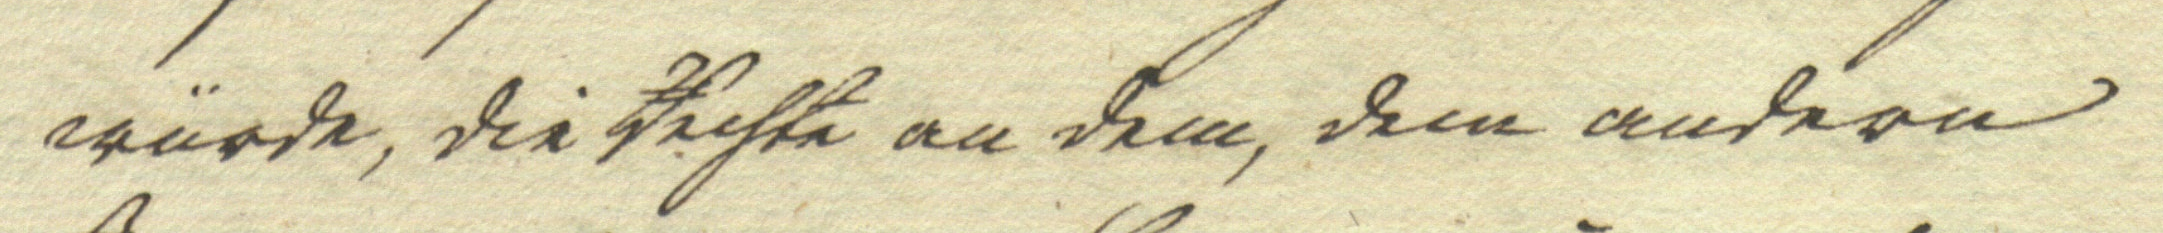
würde, die Rechte an dem, dem andern
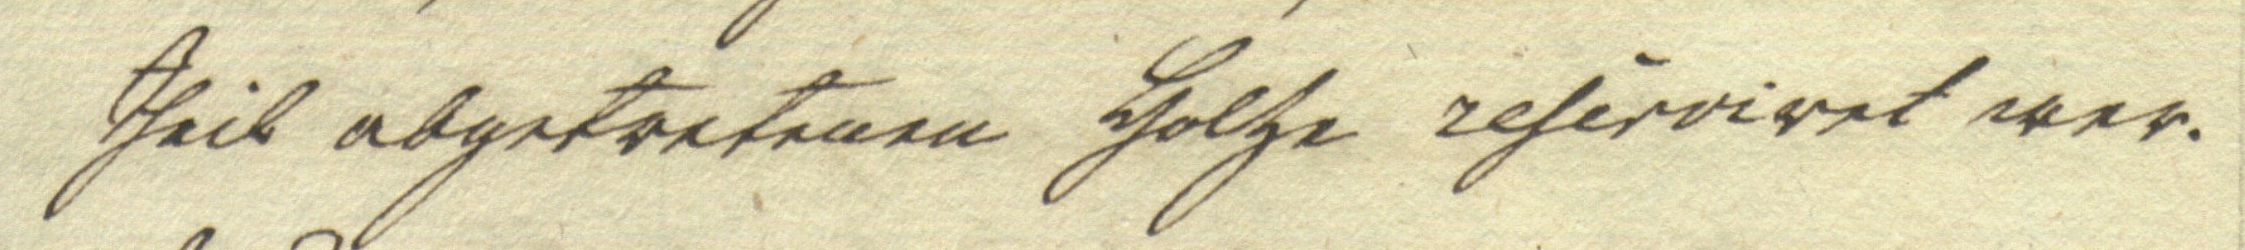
Theil abgetretenen Holze reserviret wer¬
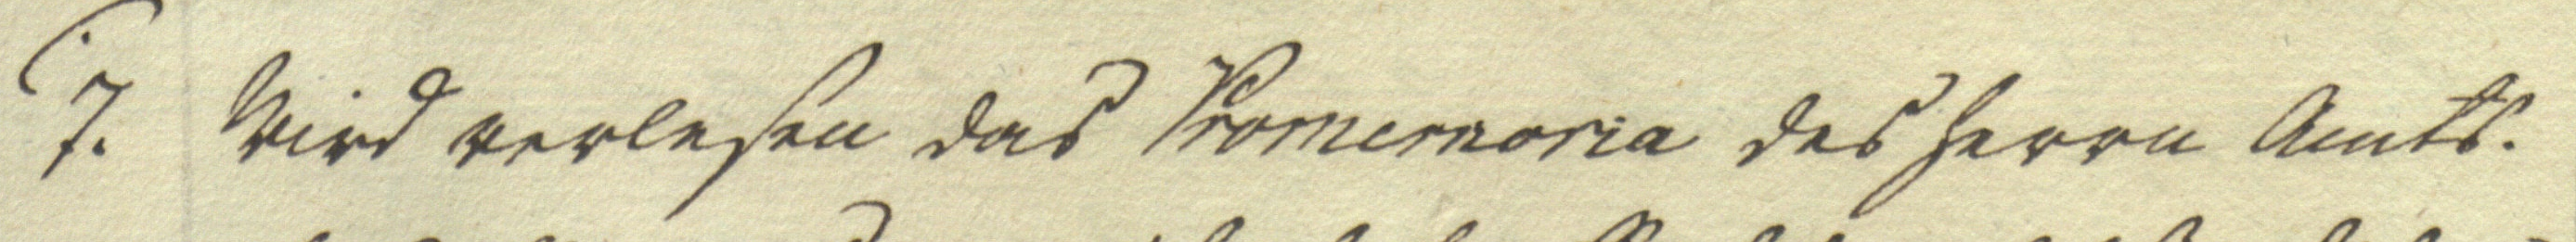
7. Wird verlesen das Promemoria des Herrn Amts¬
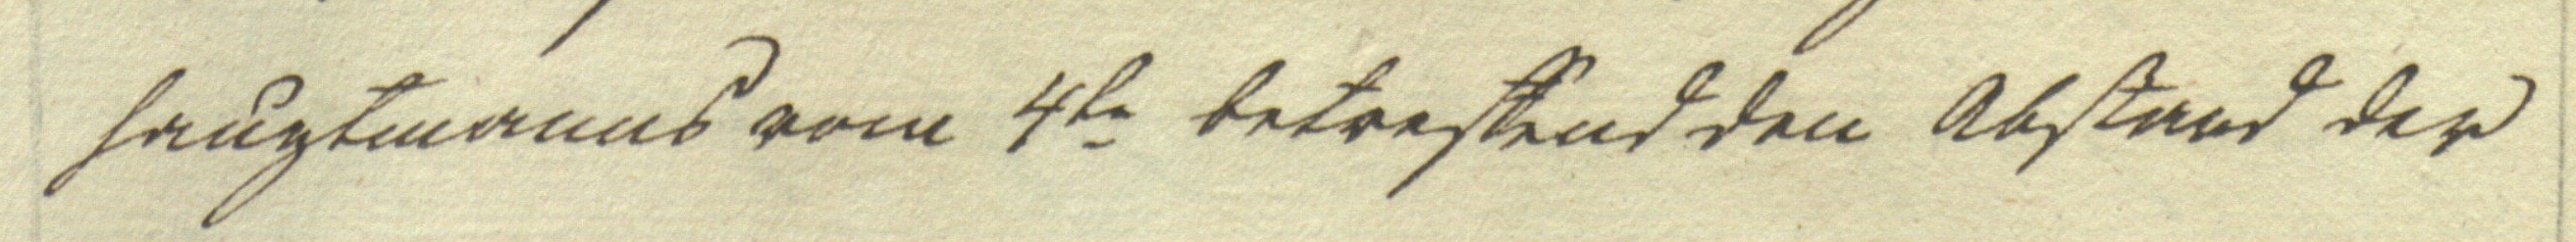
hauptmanns vom 4 te betreffend den Abstand der
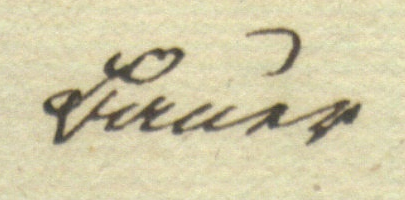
Bauer
